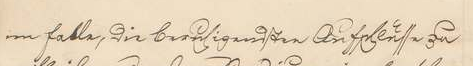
im Falle, die beruhigendsten Aufschlüsse zu
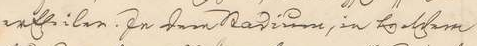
ertheilen. In dem Stadium, in welchem
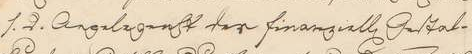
s. d. Angelegenht der finanziellen Gestal-
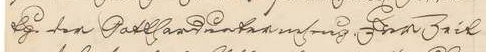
tung der Gotthardunternehmung zur Zeit
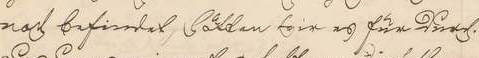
noch befindet, hätten wir es für durch-
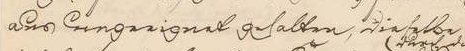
aus ungeeignet gehalten, dieselbe
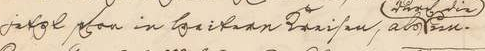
jetzt schon in weitern Kreisen, als durch die un-
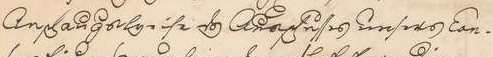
Anschauungsweise des Ausschusses unsers Con-
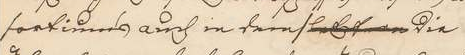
sortium's auch in dem letzternPlenum die
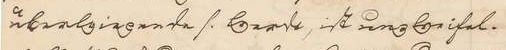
überwiegende s. werde, ist unzweifel-
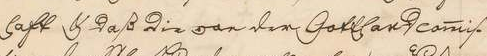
haft & daß die vor der Gotthardcommis-
